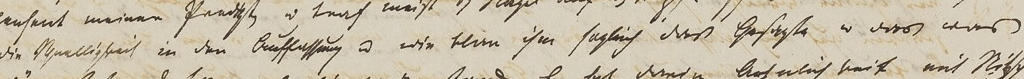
die Schnelligkeit in der Auffassung u wie klar ihm sogleich das Gesagte u das was
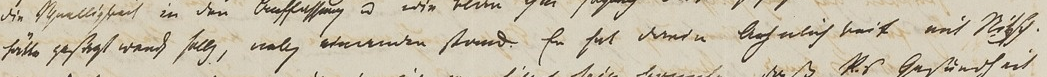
hätte gesagt werden sollen, neben einander stand. Er hat darin Aehnlichkeit mit Nitzsch.
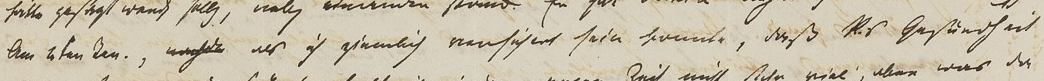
Am 4ten Jan., nachde als ich ziemlich versichert sein konnte, daß R.s Gesundheit
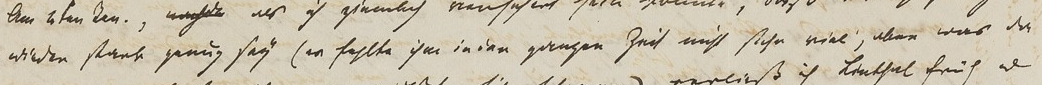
wieder stark genug sey (es fehlte ihm in der ganzen Zeit nicht sehr viel, aber was da
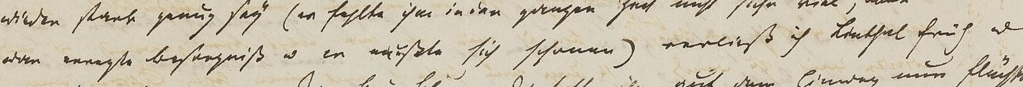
war erregte Besorgniß u er mußte sich schonen) verließ ich Linthal früh u
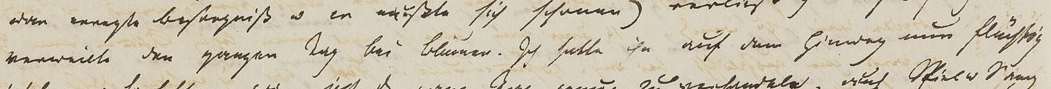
verweilte den ganzen Tag bei Blumer. Ich hatte ihn auf dem Hinweg nur flüchtig
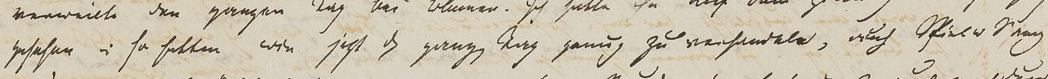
gesehen u so hatten wir jetzt den ganzen Tag genug zu verhandeln, auch Spiel u Sang
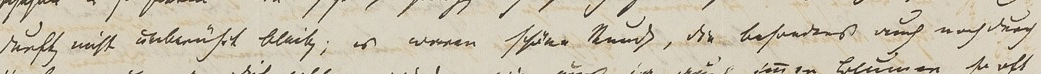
durften nicht unberührt bleiben; es waren schöne Stunden, die besonders auch noch durch
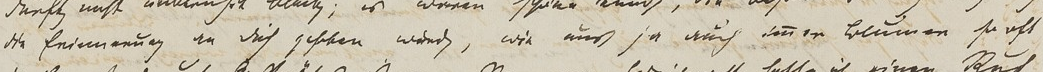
die Erinnerung an dich gehoben wurden, wie uns ja auch immer Blumer so oft
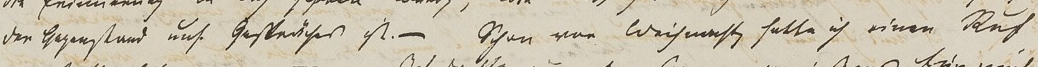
der Gegenstand uns. Gespräches ist. – Schon vor Weihnachten hatte ich einen Ruf
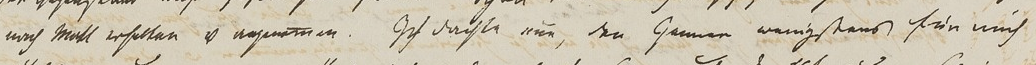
nach Matt erhalten & angenommen. Ich dachte nun, den Jenner wenigstens für mich
